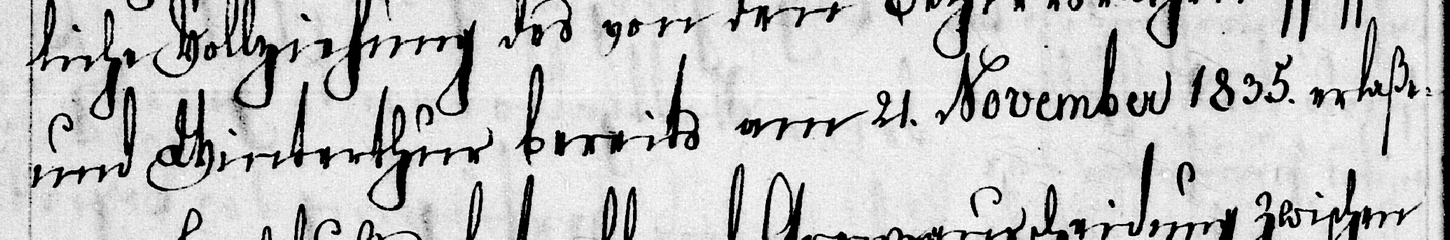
und Winterthur bereits am 21. November 1835. erlaße¬
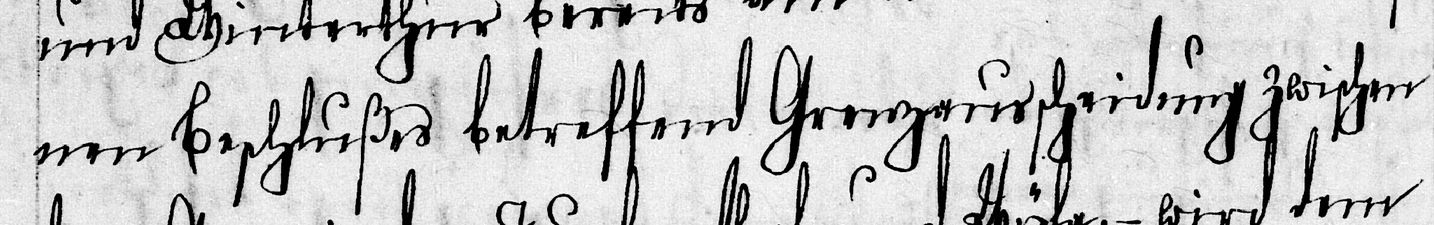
nen Beschlußes betreffend Grenzausscheidung zwischen
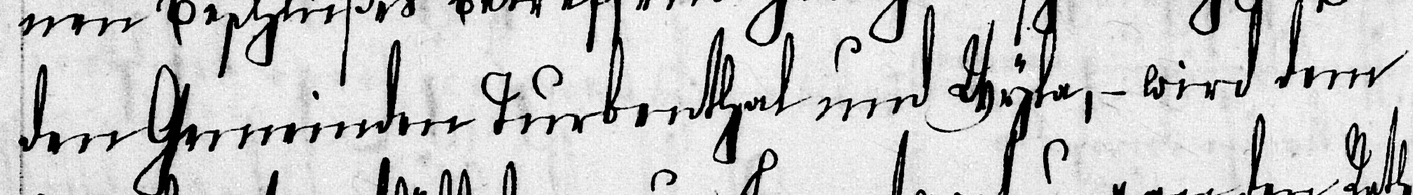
den Gemeinden Turbenthal und Wyla, – wird dem
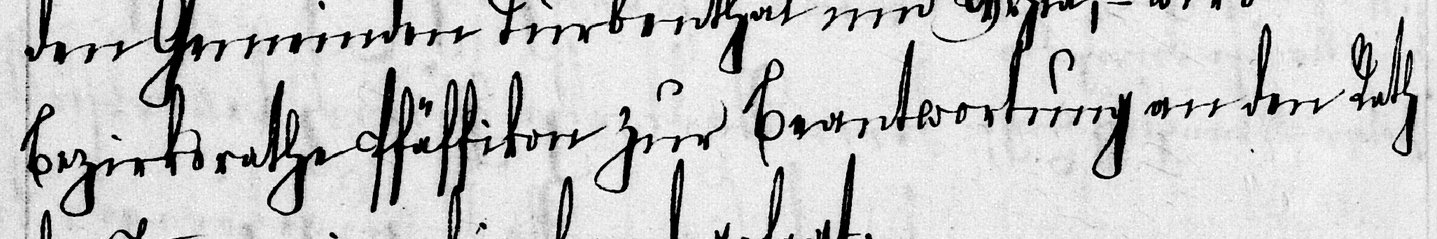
Bezirksrathe Pfäffikon zur Beantwortung an den Rath
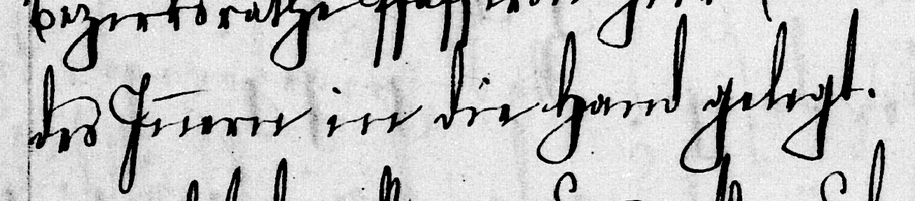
des Innern in die Hand gelegt.
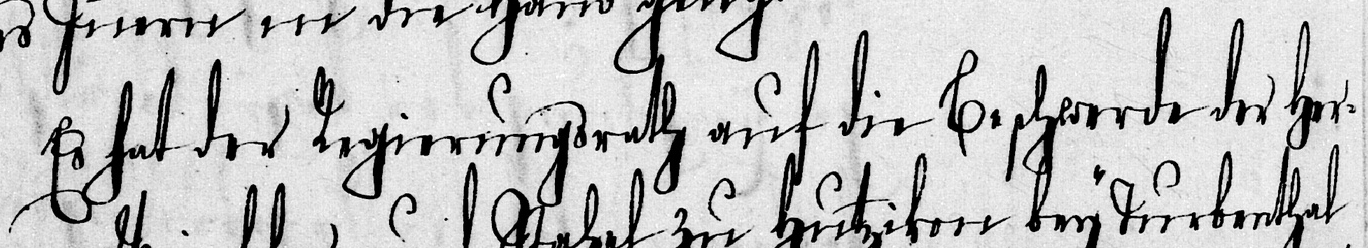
Es hat der Regierungsrath auf die Beschwerde der H¬
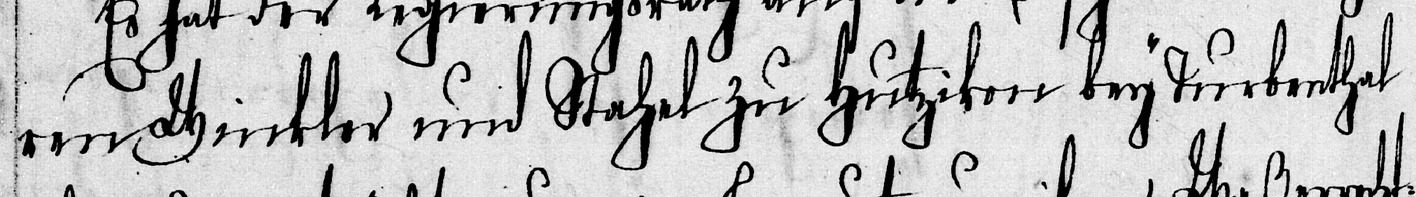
ren Winkler und Stahel zu Hutzikon bey Turbenthal
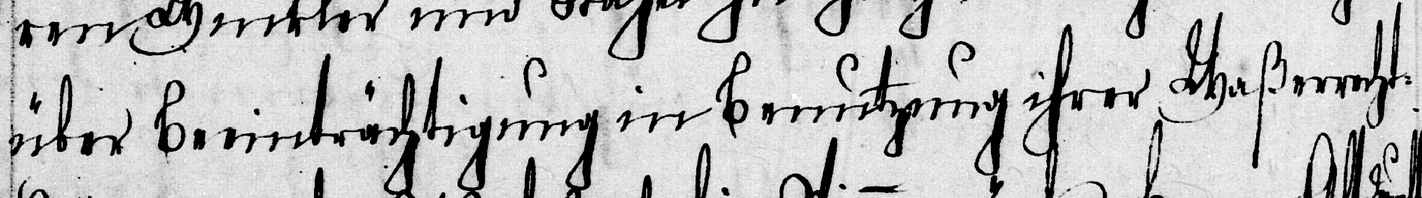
über Beeinträchtigung in Benutzung ihrer Waßerrec¬
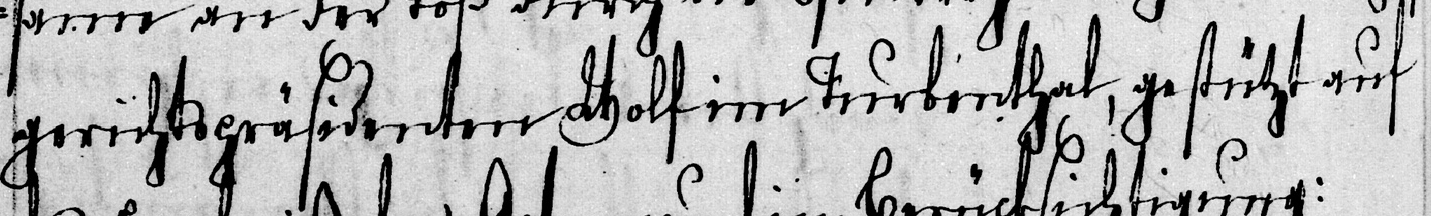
gerichtspräsidenten Wolf im Turbenthal, gestützt auf
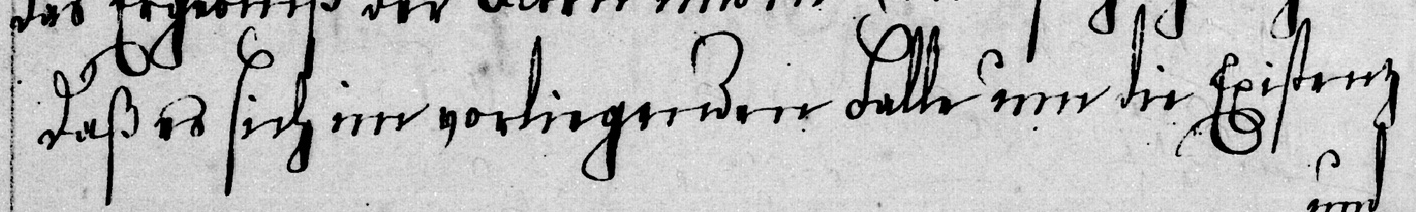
Daß es sich im vorliegenden Falle um die Existenz
